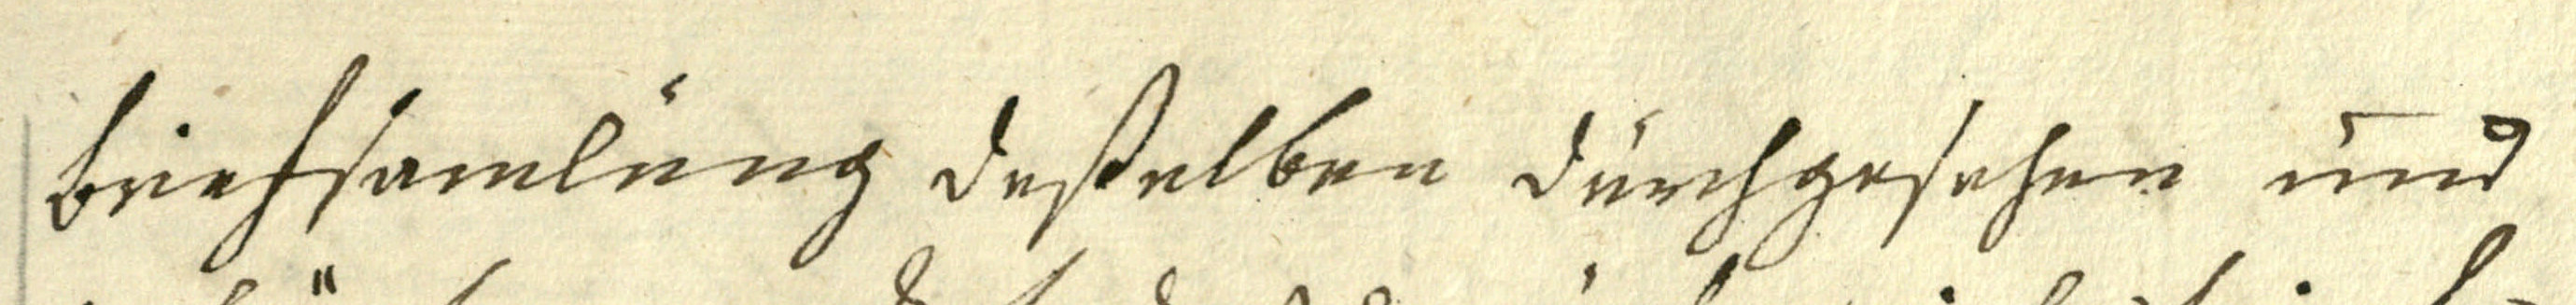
Briefsamlung deßelben durchgesehen und
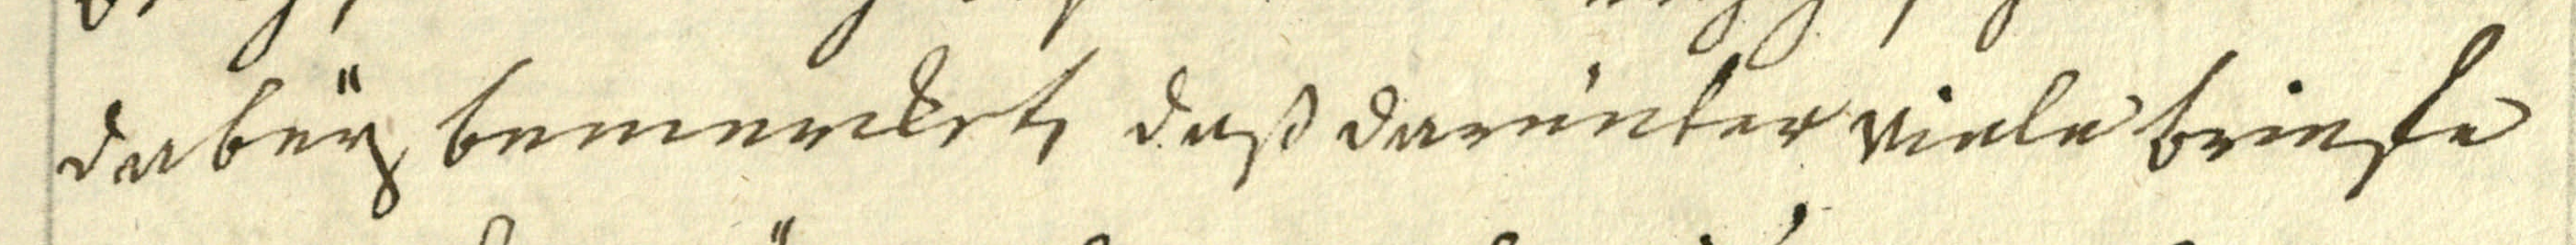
dabeÿ bemercket, daß darunter viele Briefe
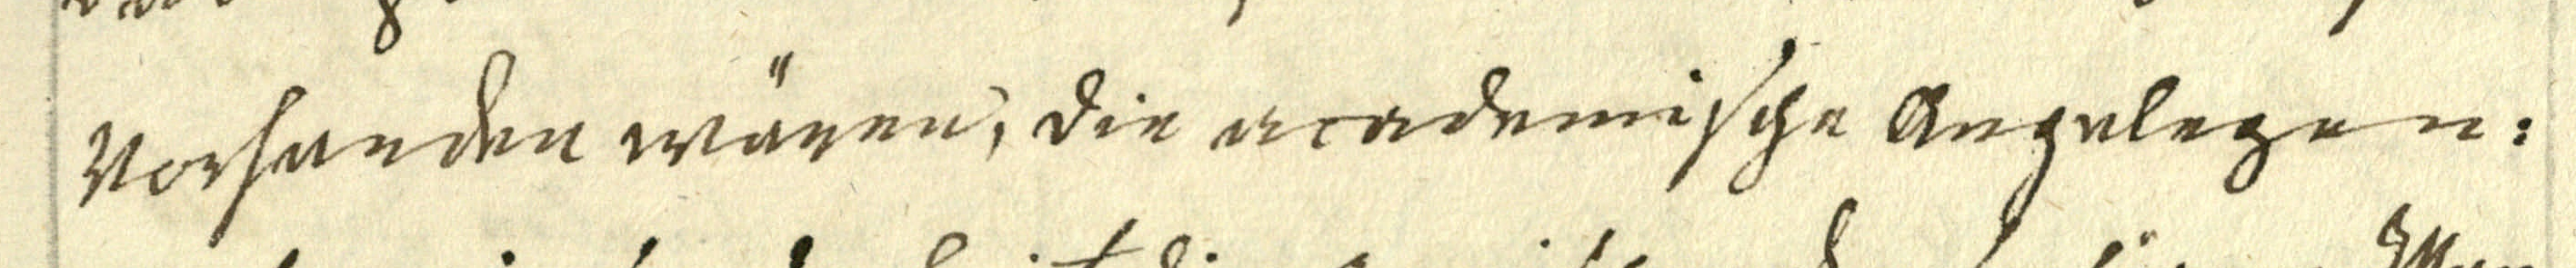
vorhanden wären, die academische Angelegen¬
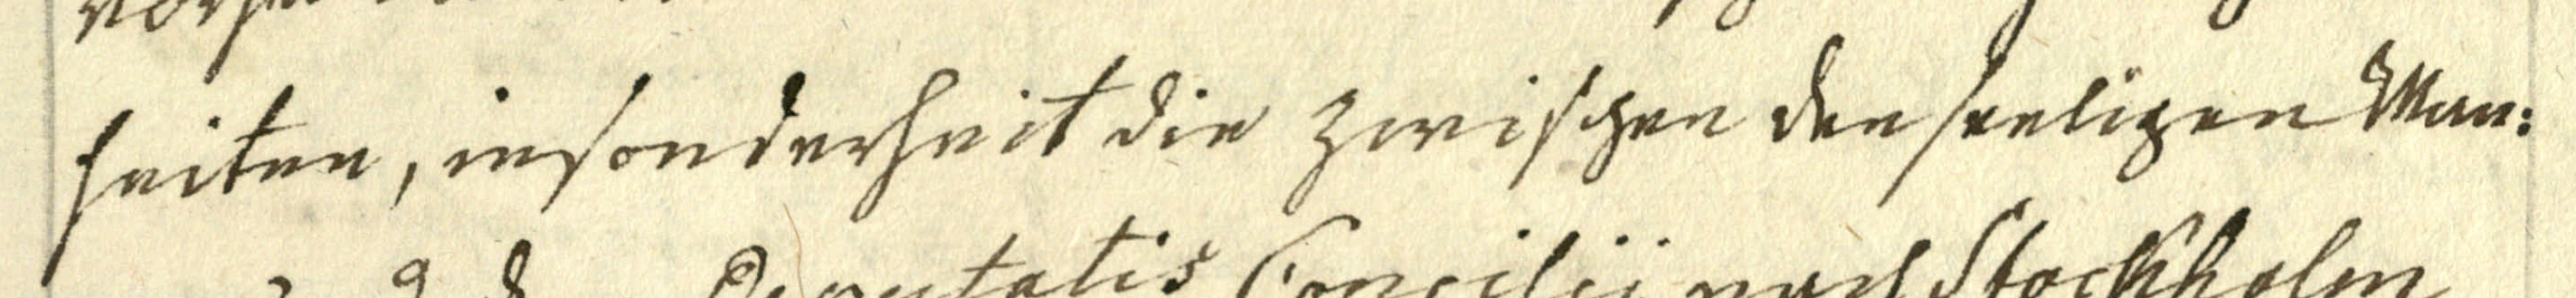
heiten, insonderheit die zwischen den seeligen Man¬
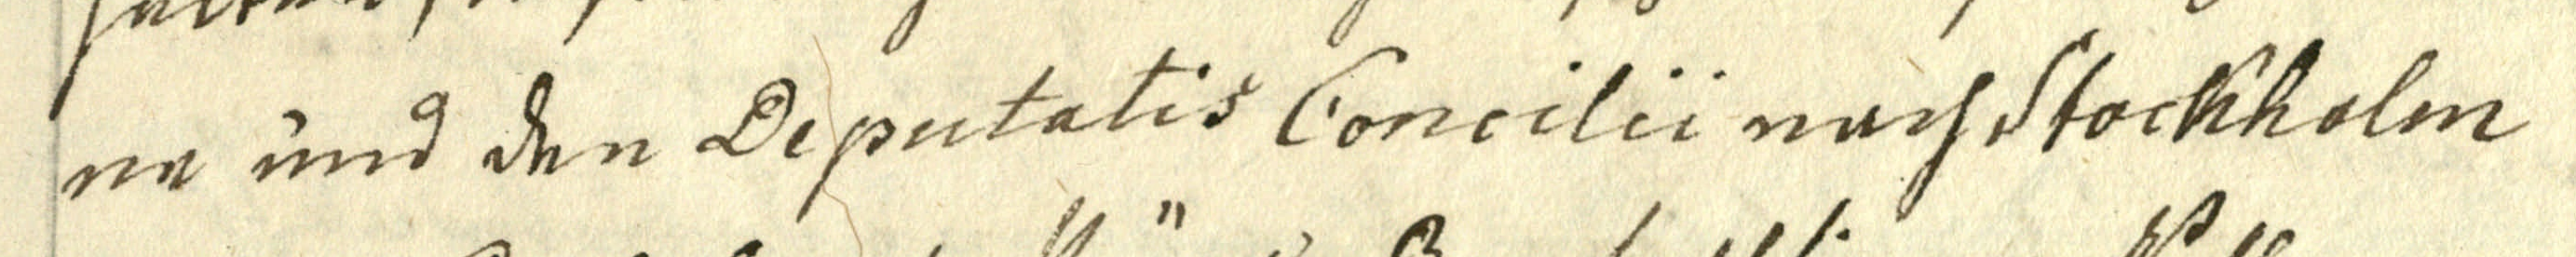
ne und den Deputatis Concilii nach Stockholm
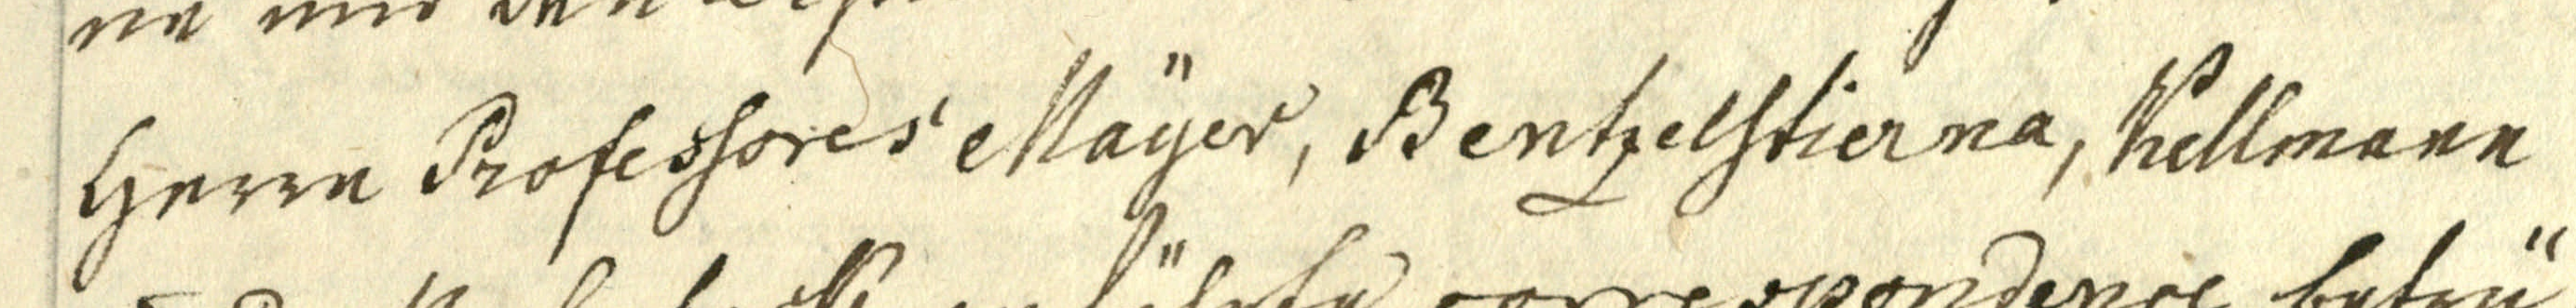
Herrn Professores Maÿer, Bentzelstierna, Kellmann
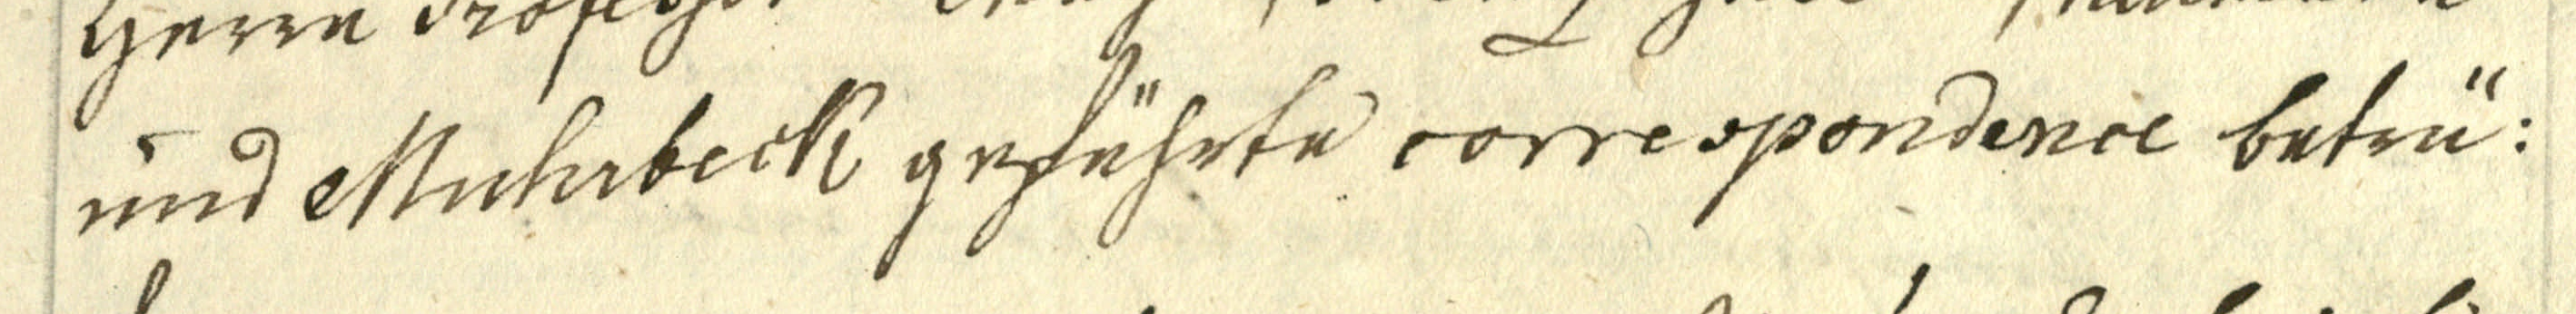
und Muhrbeck geführte correspondence beträ¬
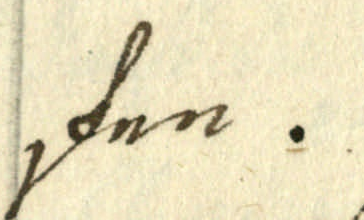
fen.
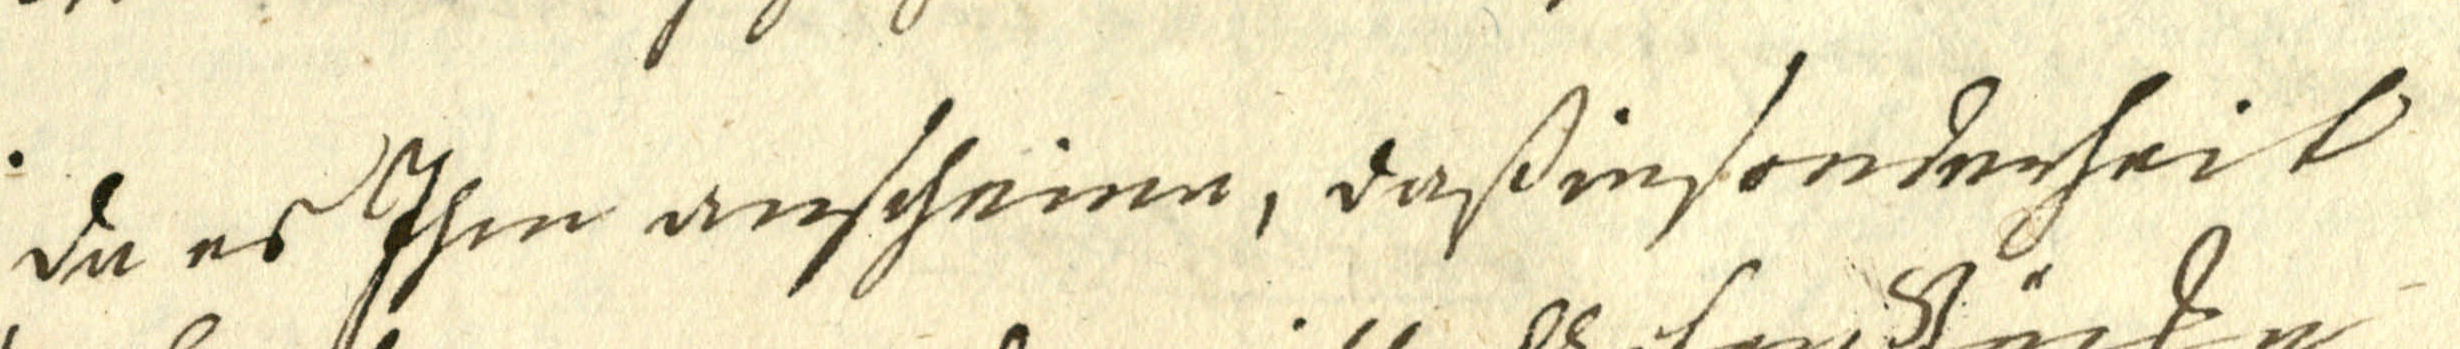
Da es Ihm anscheine, daß insonderheit
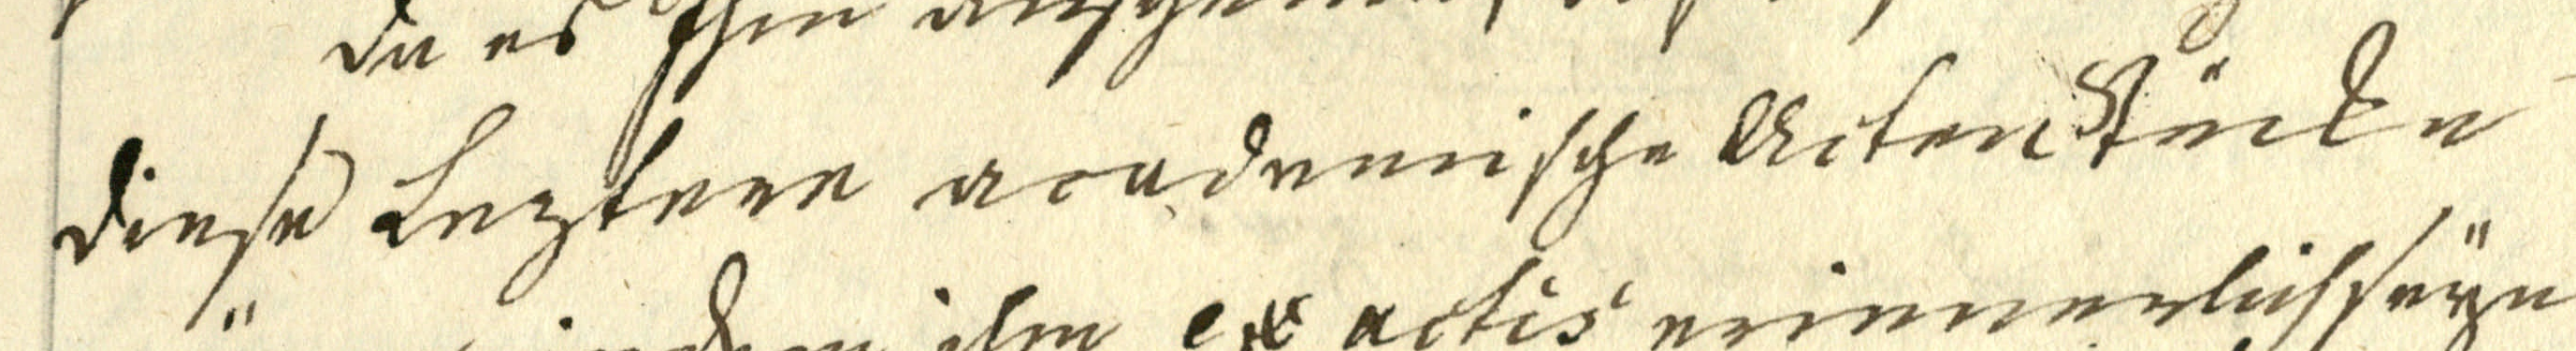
diese leztern academische Actenstücke
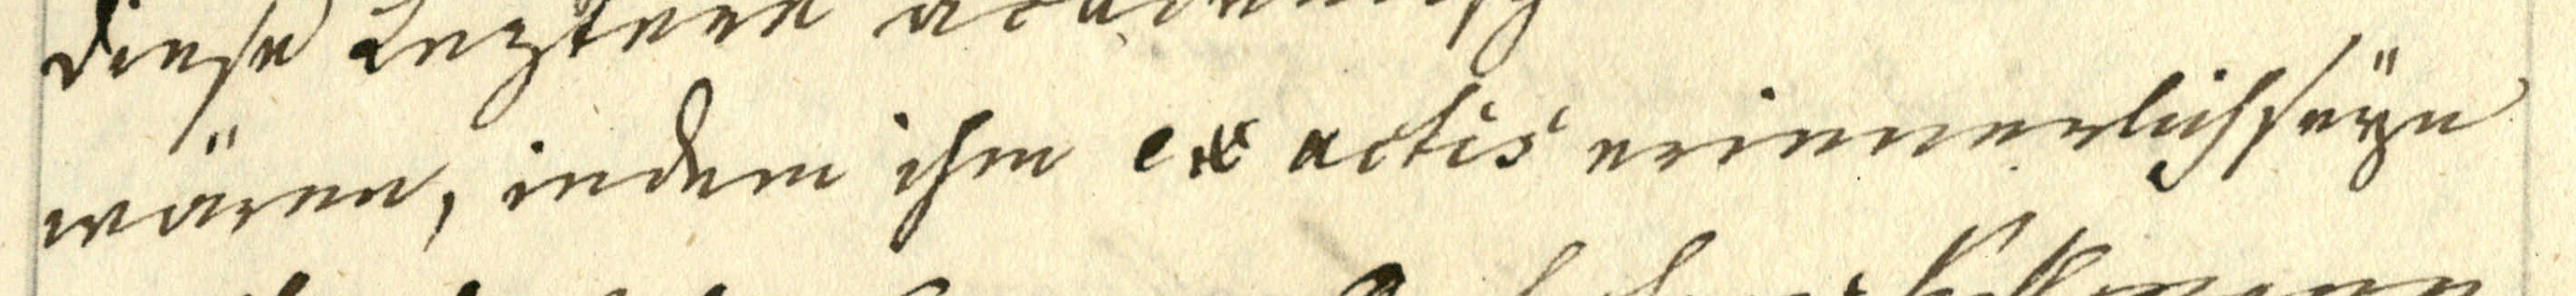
wären, indem ihm ex actis erinnerlich seÿn
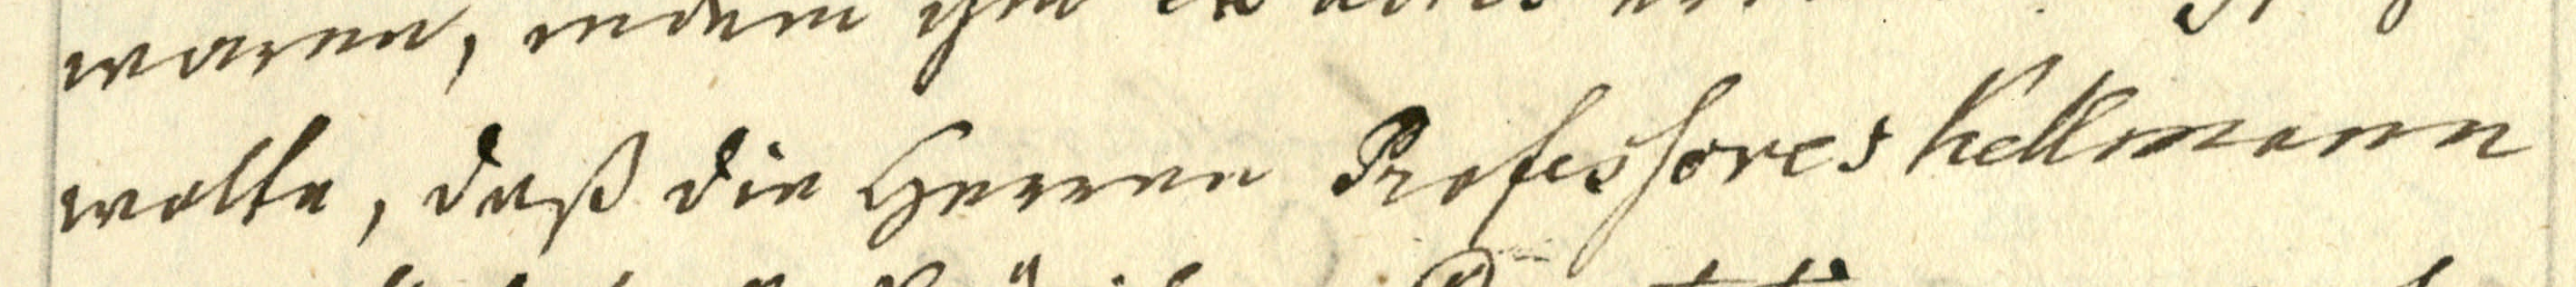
wolte, daß die Herren Professores Kellmann
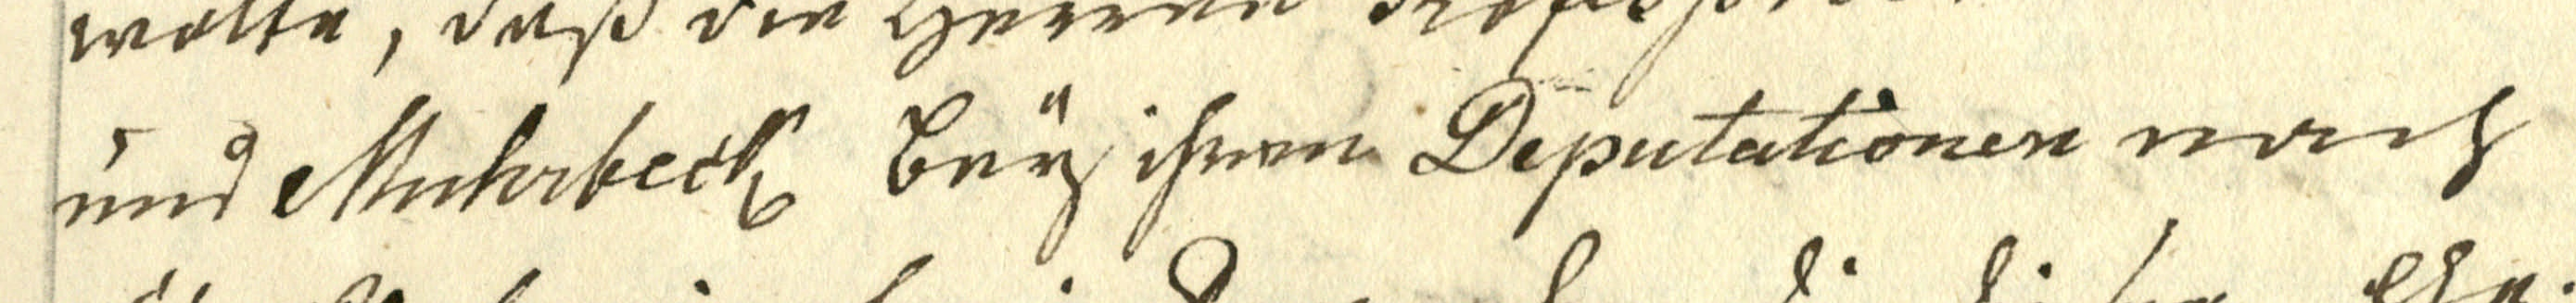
und Muhrbeck beÿ ihren Disputationen nach
